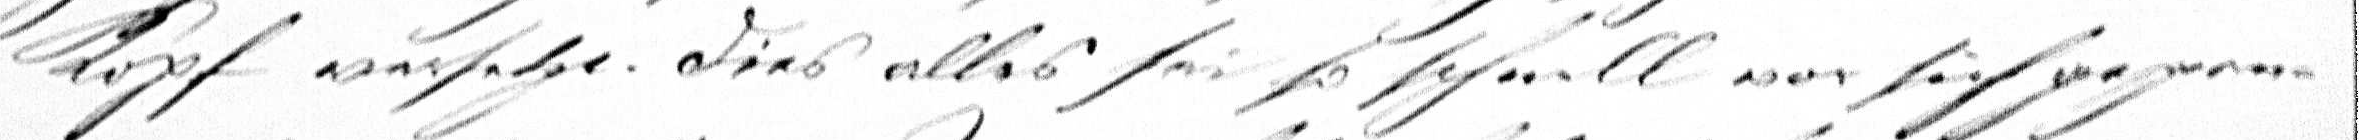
Kopf versetzt. Dies alles sei so schnell vor sich gegan¬
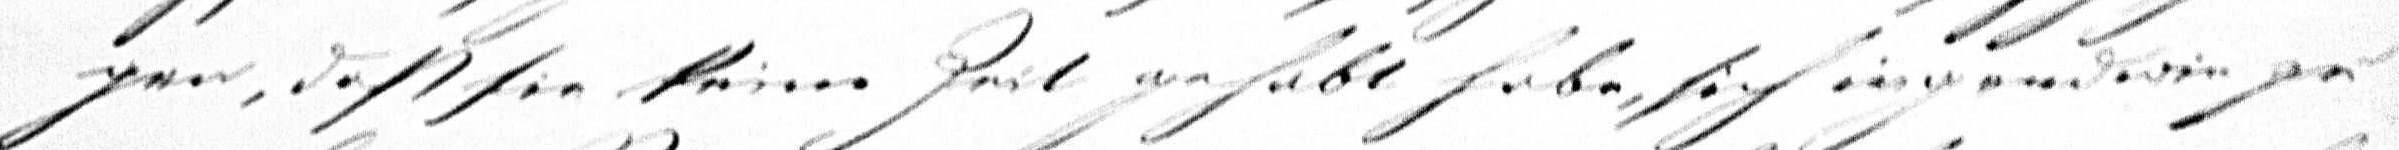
gen, daß sie keine Zeit gehabt habe, sich irgendwie zu
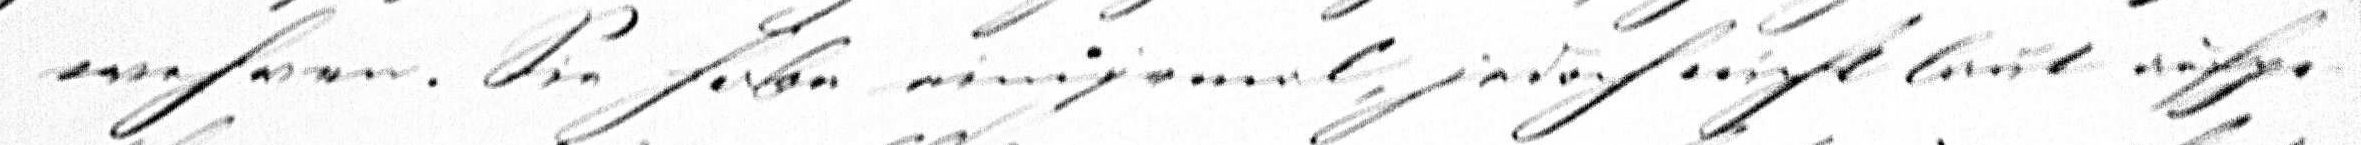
wehren. Sie habe einige mal, jedoch nicht laut aufge¬
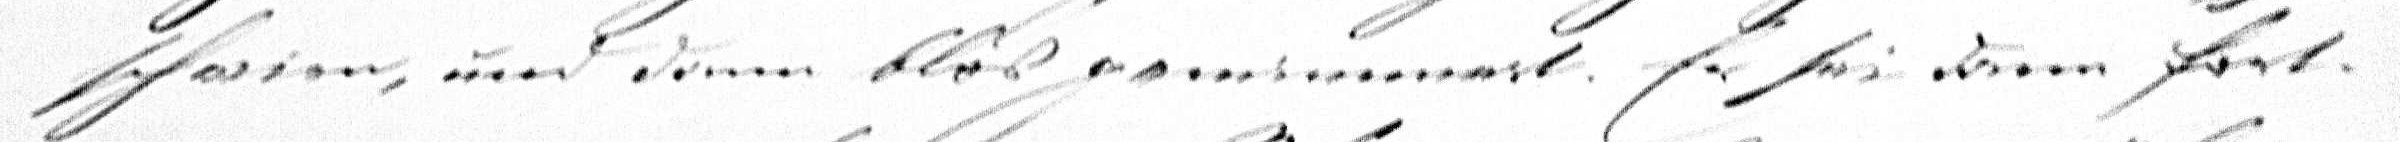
schrien, und denn blos gewimmert. Er sei dann fort¬
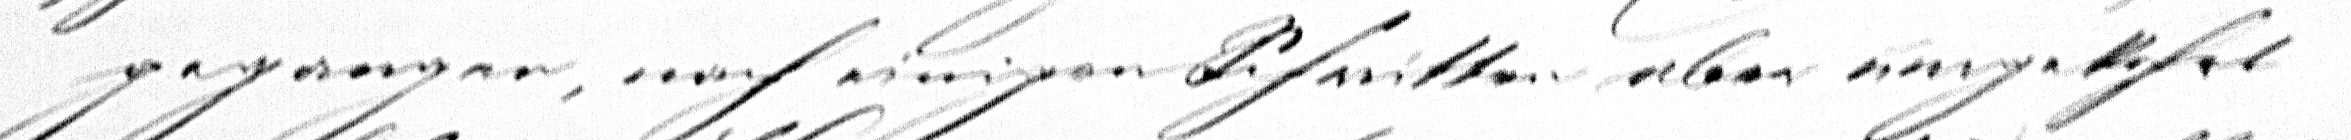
gegangen, nach einigen Schritte aber umgekehrt
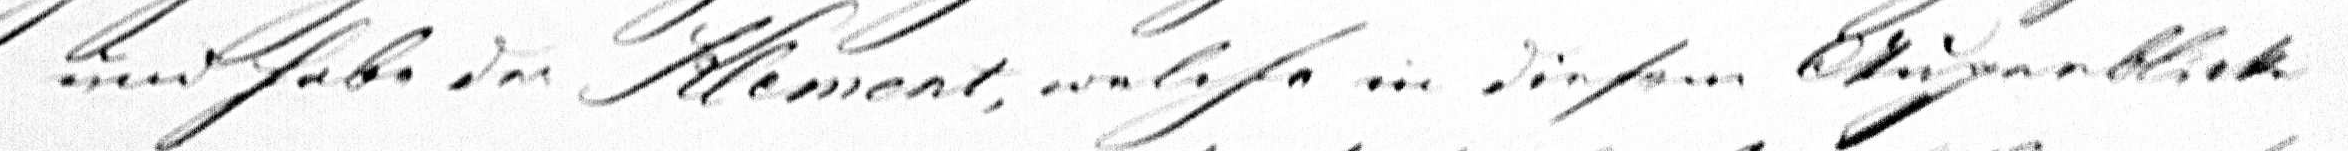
und habe der Klement, welche in diesem Augenblick
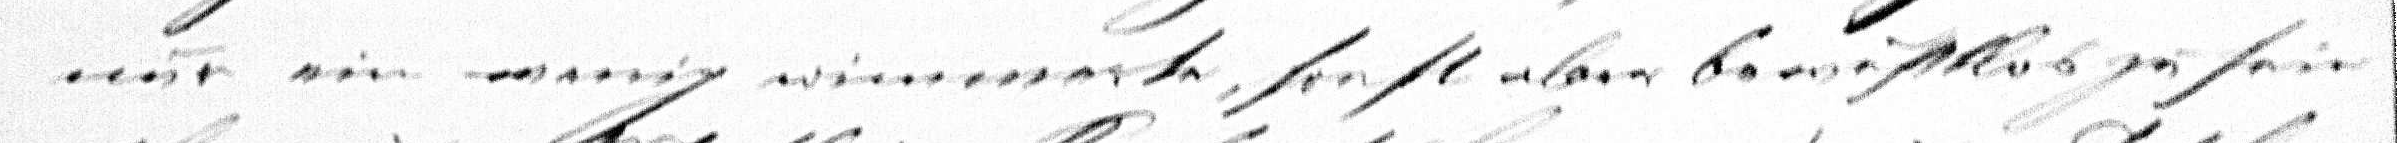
nur ein wenig wimmerte, sonst aber bewußtlos zu sein
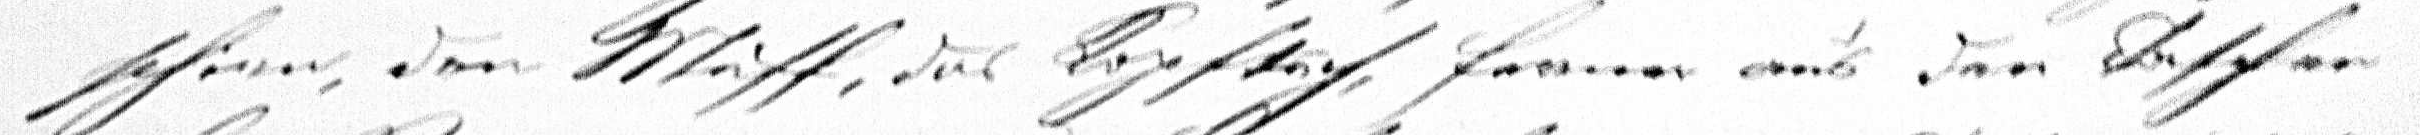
schien, den Muff, das Kopftuch, ferner aus den Taschen
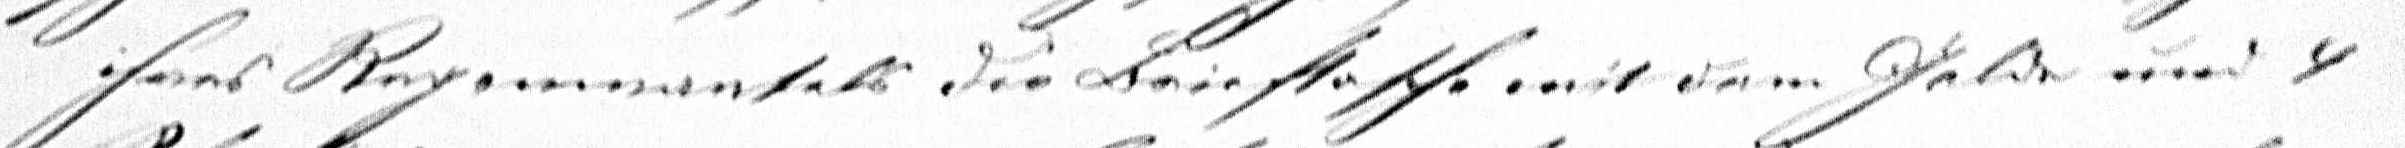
ihres Regenmantels die Brieftasche mit dem Gelde und 4
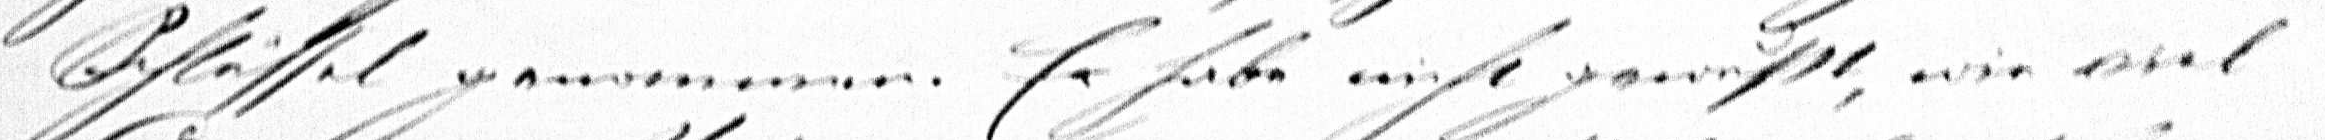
Schlüssel genommen. Er habe nicht gewußt, wie viel
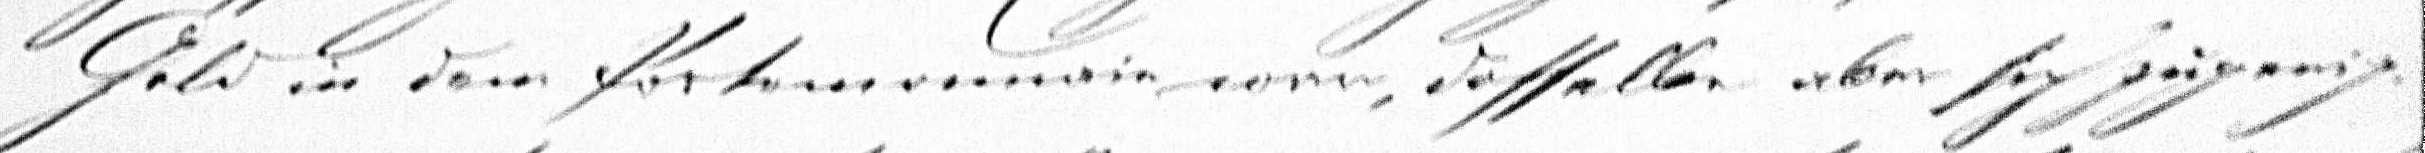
Geld in dem Portemonnaie war, dasselbe aber sich zugeeig¬
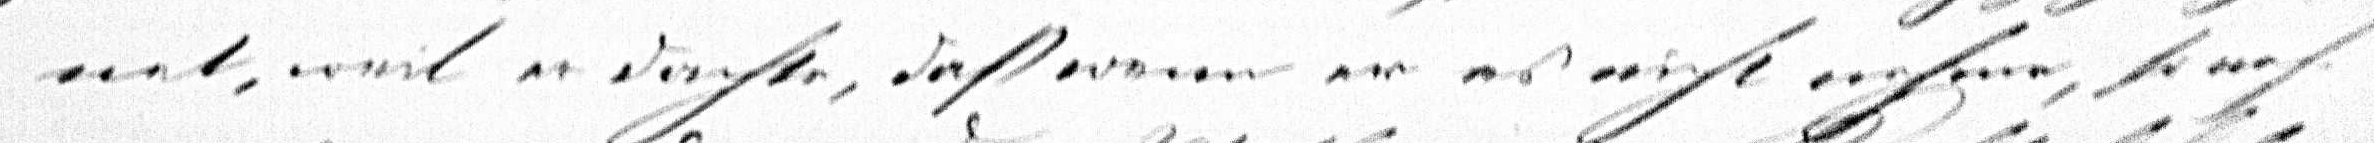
net, weil er dachte, daß wenn er es nicht nehme, so neh
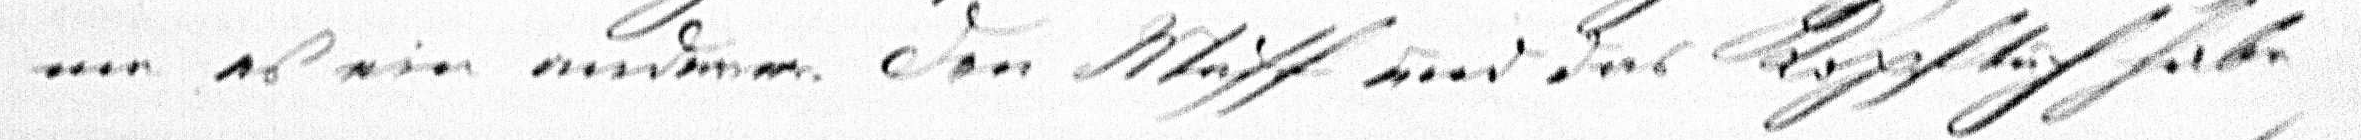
me es ein anderer. Den Muff und das Kopftuch habe
